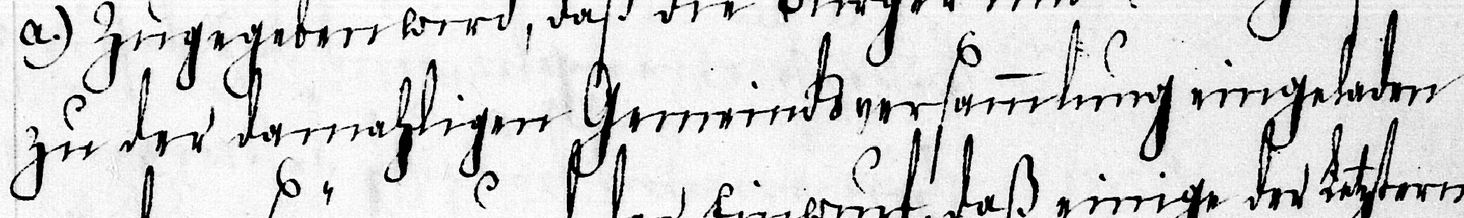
zu der damahligen Gemeindsversammlung eingeladen
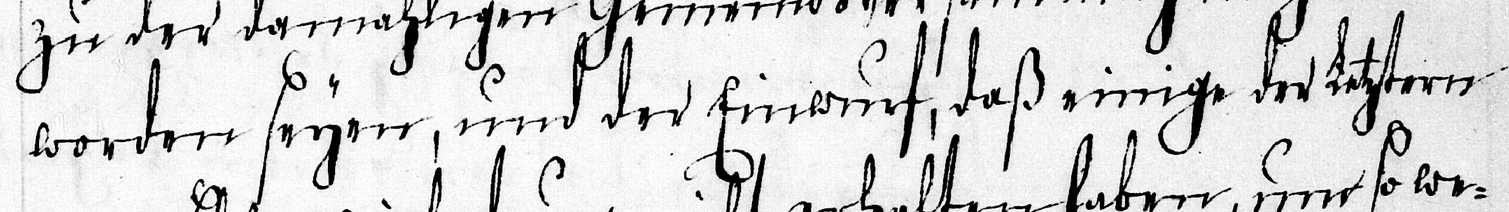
worden seyen, und der Einwurf, daß einige der Letztern
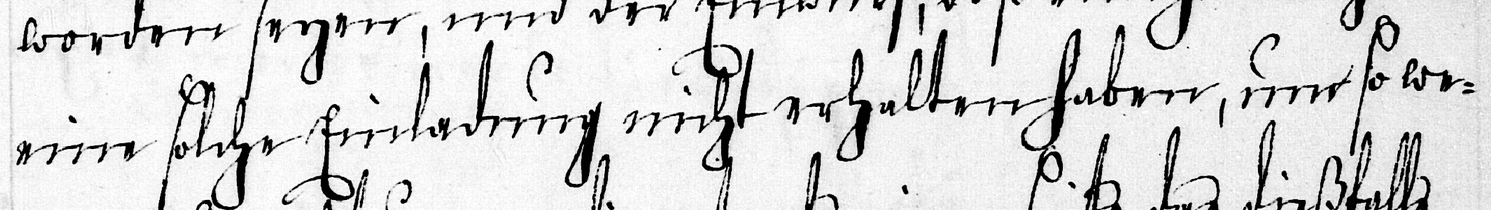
eine solche Einladung nicht erhalten haben, um so we¬
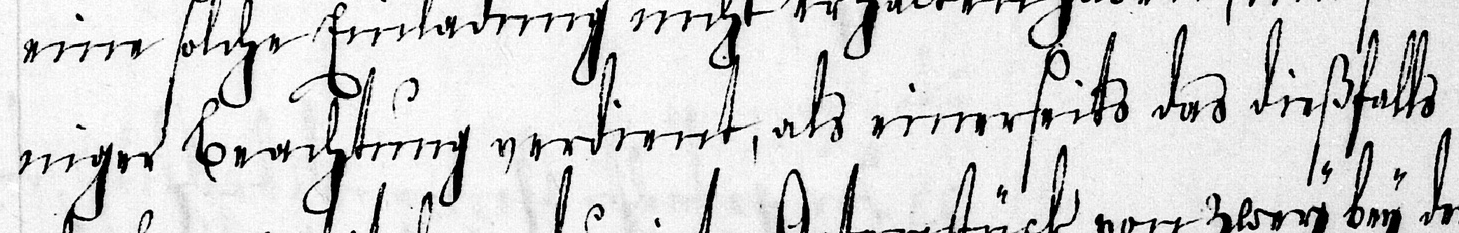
niger Beachtung verdient, als einerseits das dießfalls
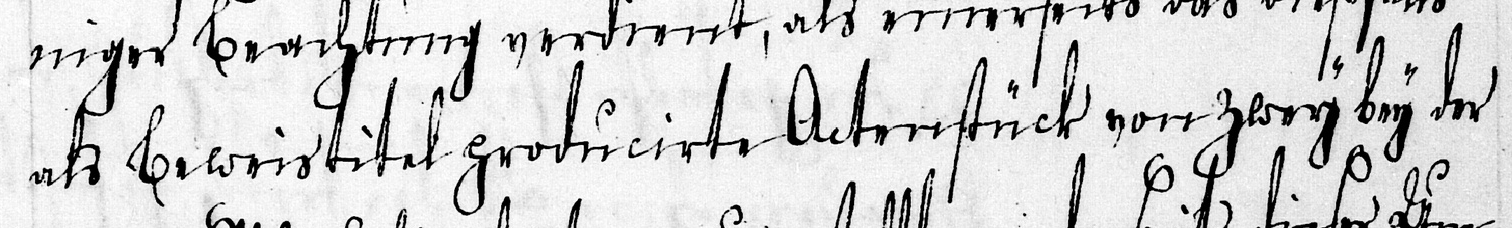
als Beweistitel producirte Actenstück von zwey bey der
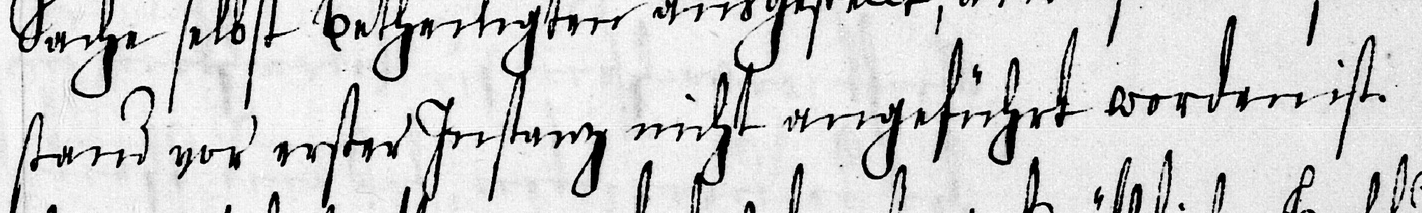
stand vor erster Instanz nicht angeführt worden ist.
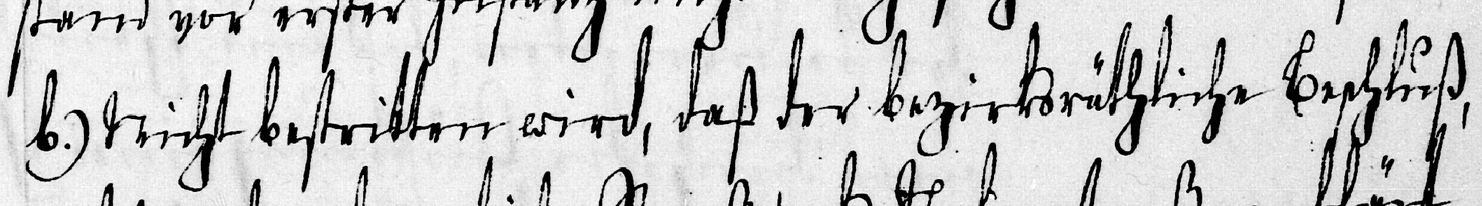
b.) Nicht bestritten wird, daß der bezirksräthliche Beschluß,
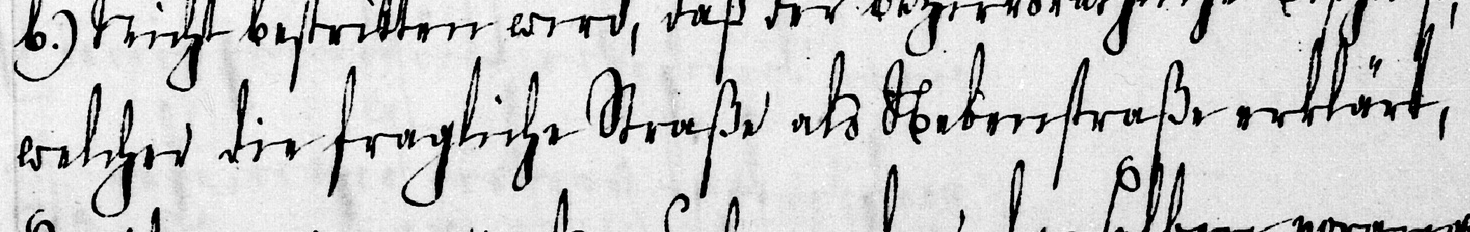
welcher die fragliche Straße als Nebenstraße erklärt,
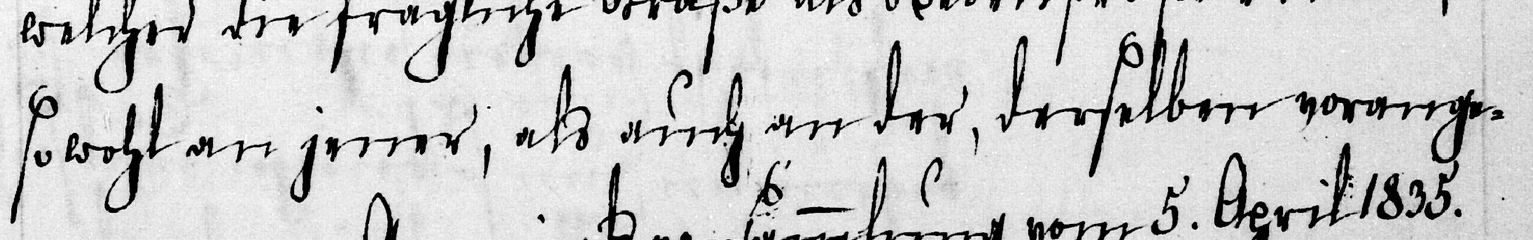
sowohl an jener, als auch an der, derselben vorange¬
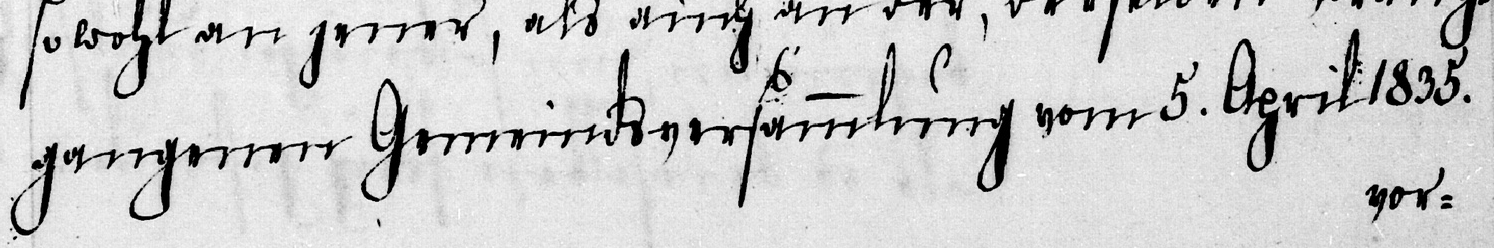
gangenen Gemeindsversammlung vom 5. April 1835.
